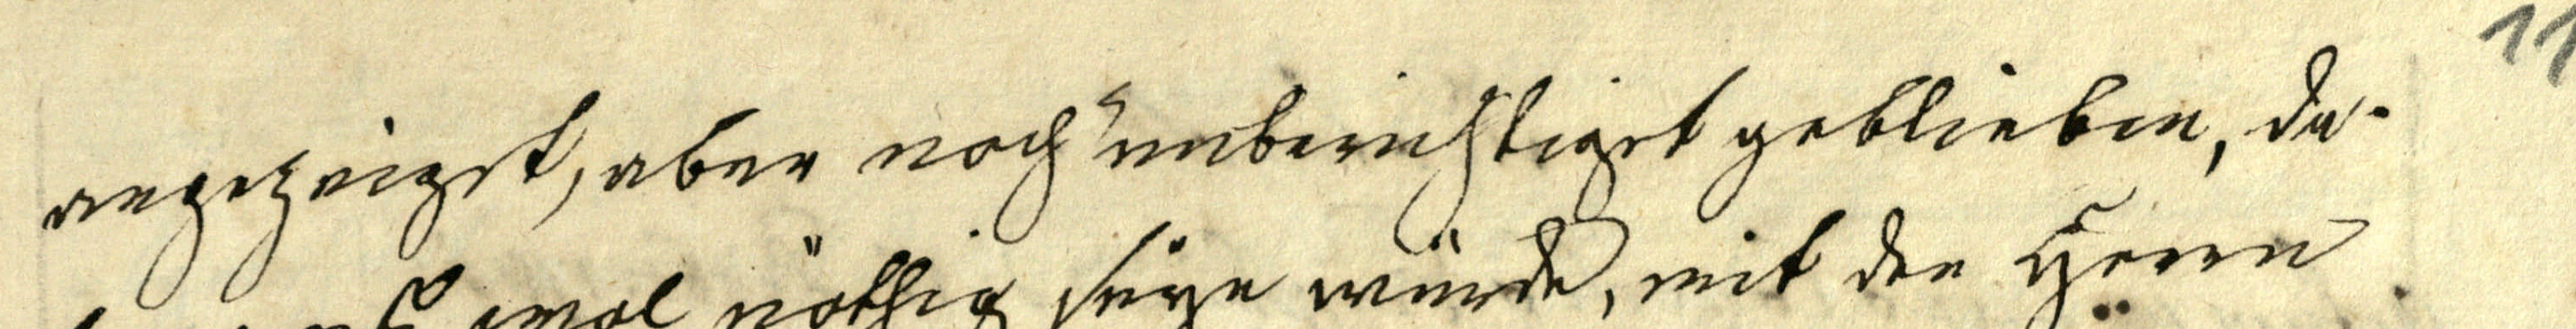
angezeiget, aber noch unberichtiget geblieben, da¬
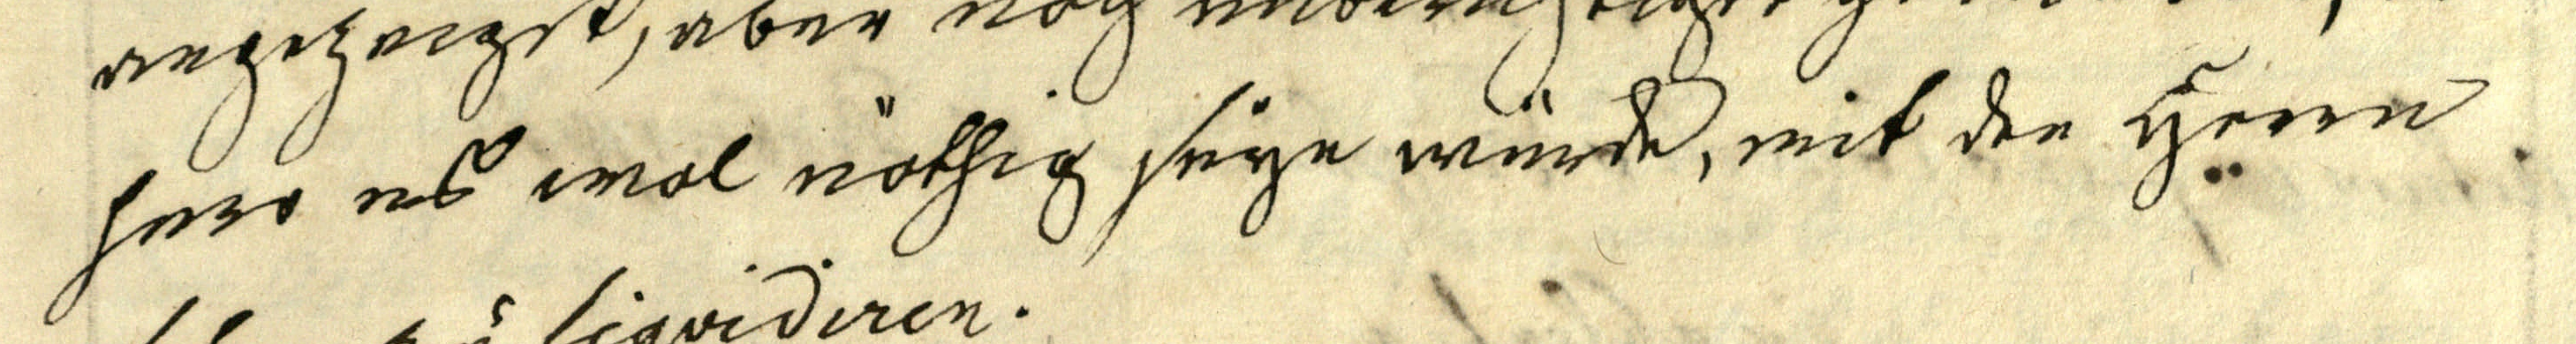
hero es wol nöthig seÿn würde, mit den Herrn
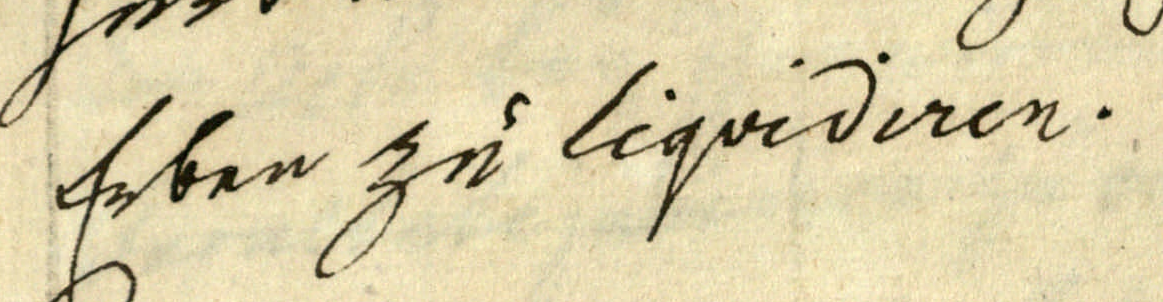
Erben zu liquidiren.
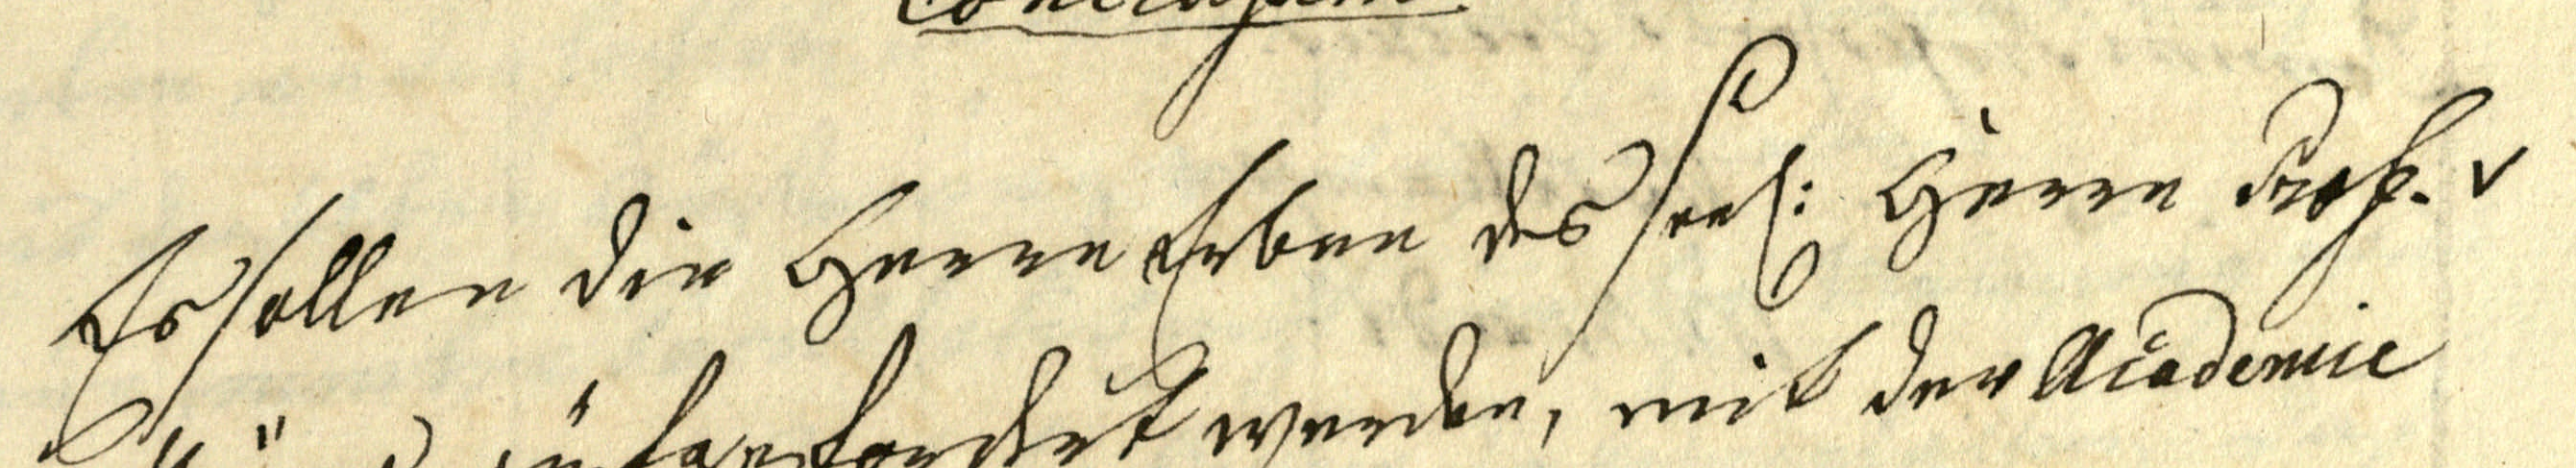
Es sollen die Herrn Erben des seel. Herrn Prof.
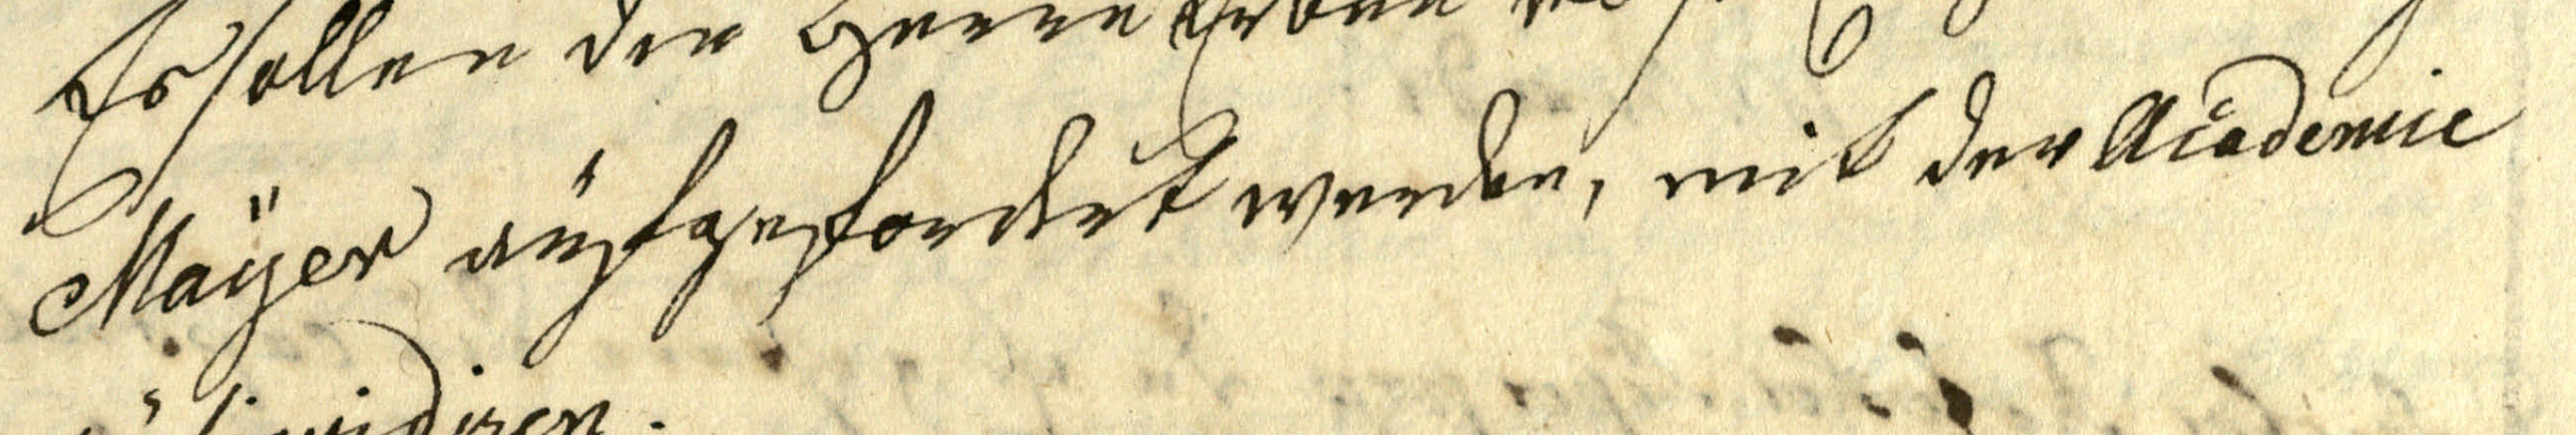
Maÿer aufgefordert werden, mit der Academie
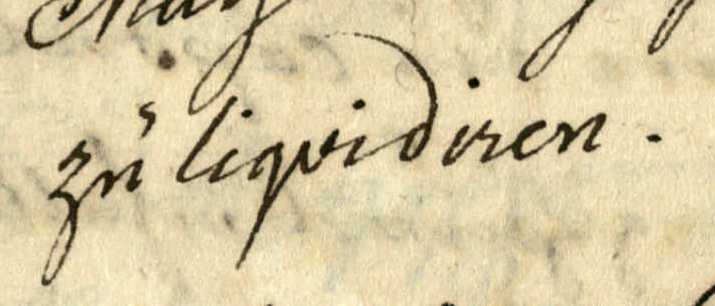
zu liquidiren.
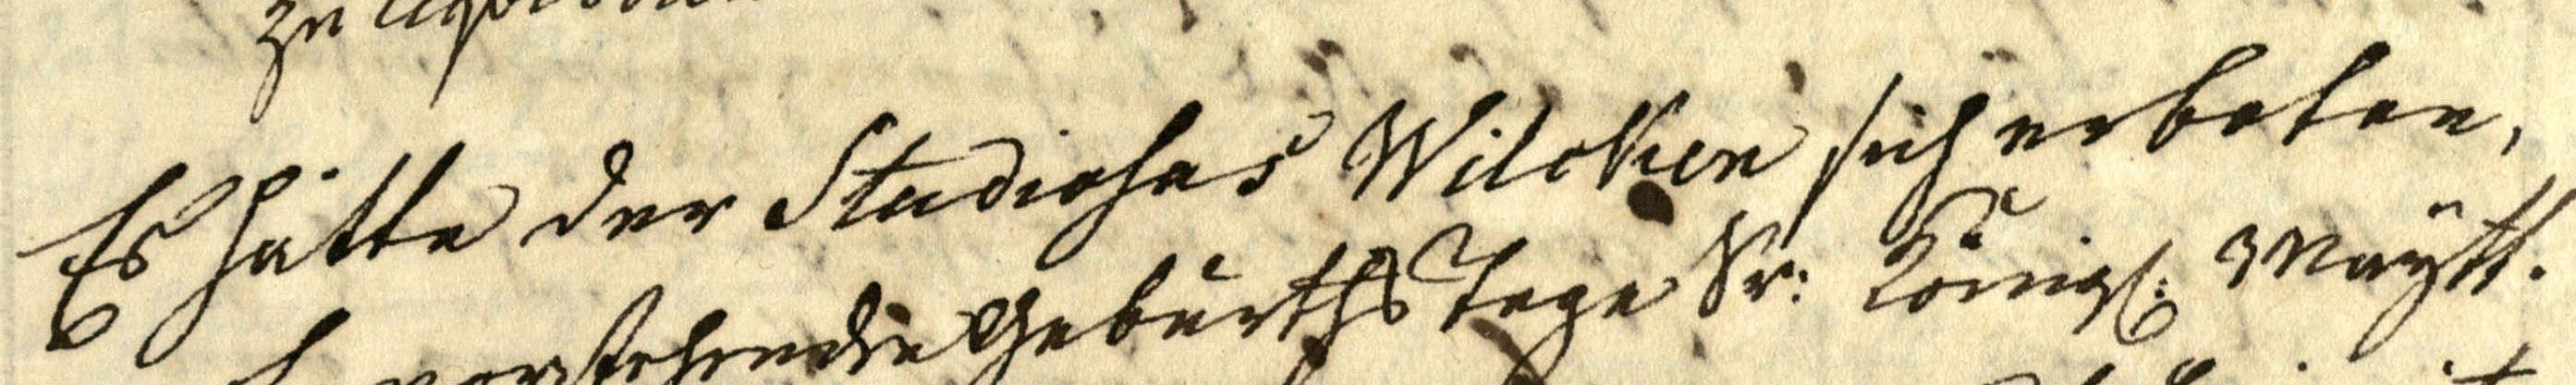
Es hätte der Studiosus Wilcken sich erboten,
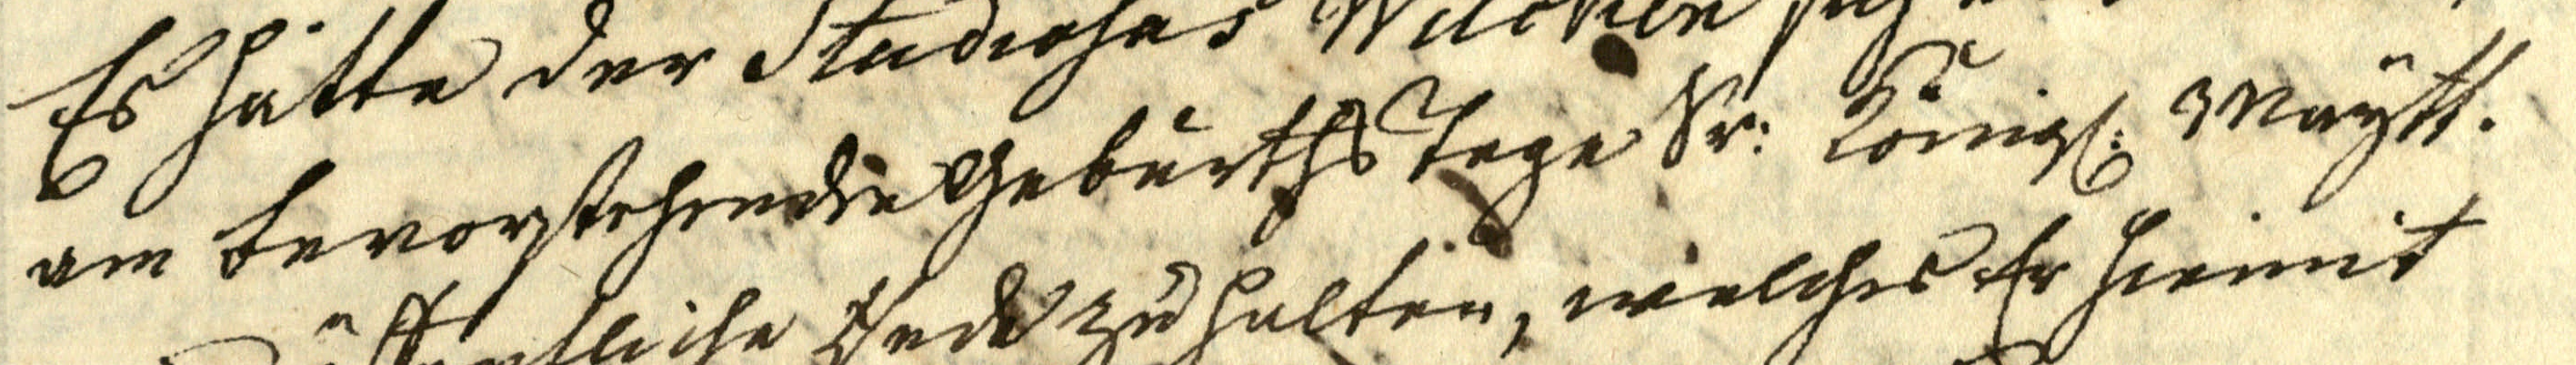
am bevorstehenden Geburths Tage Sr Königl. Maÿtt.
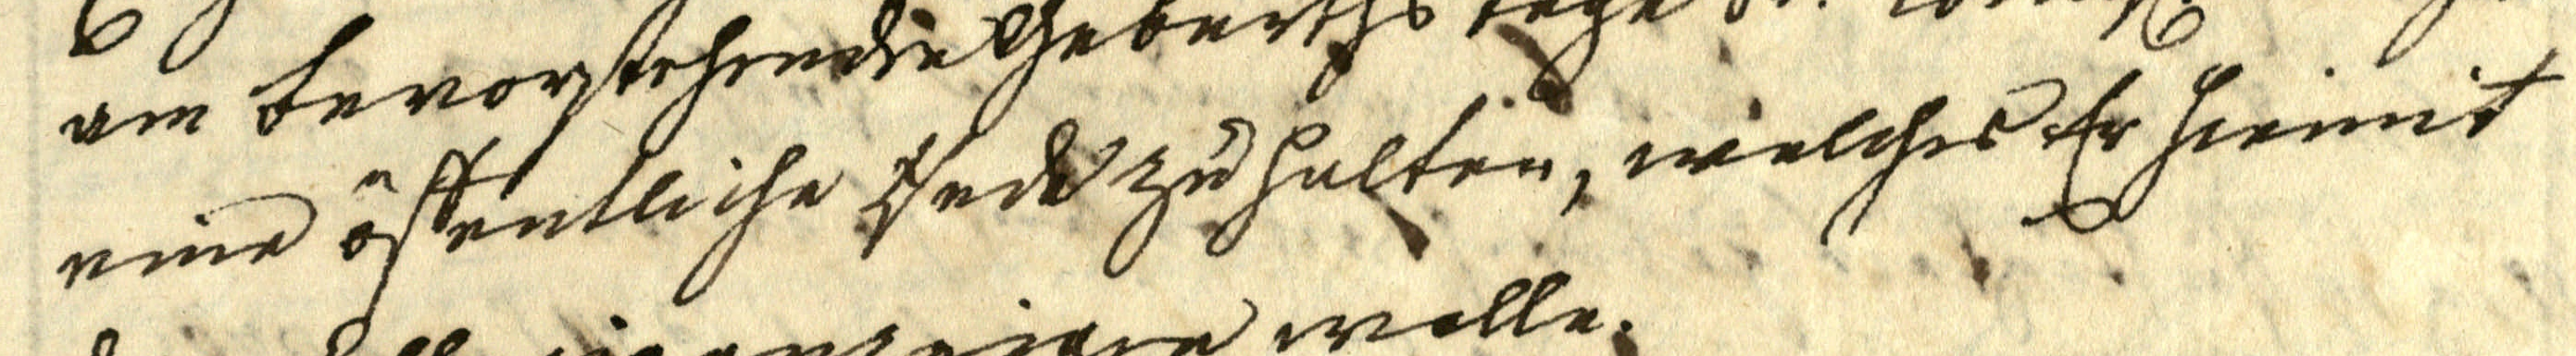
eine öffentliche Rede zu halten, welches Er hiemit
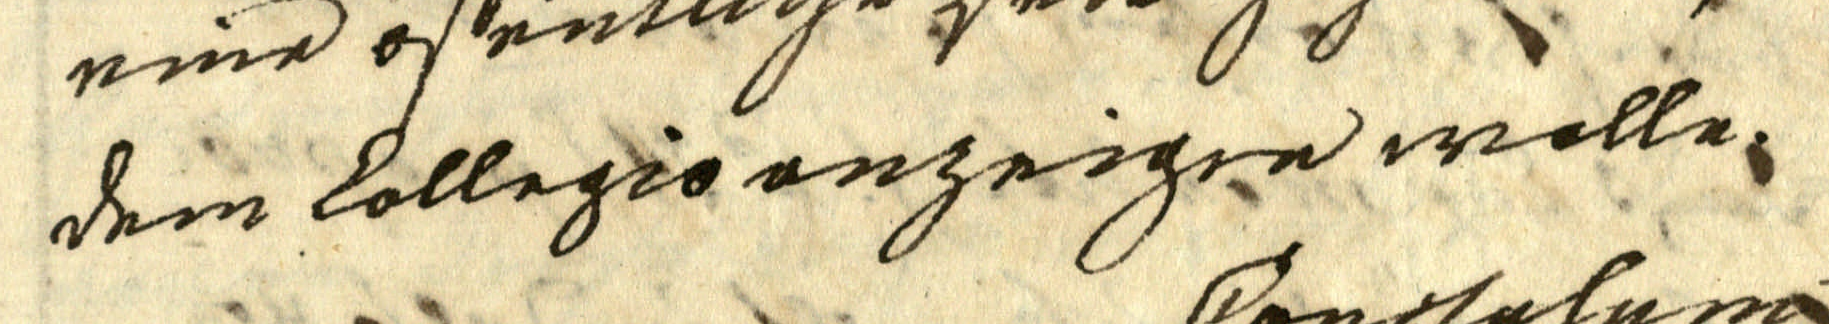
dem Collegio anzeigen wolle.
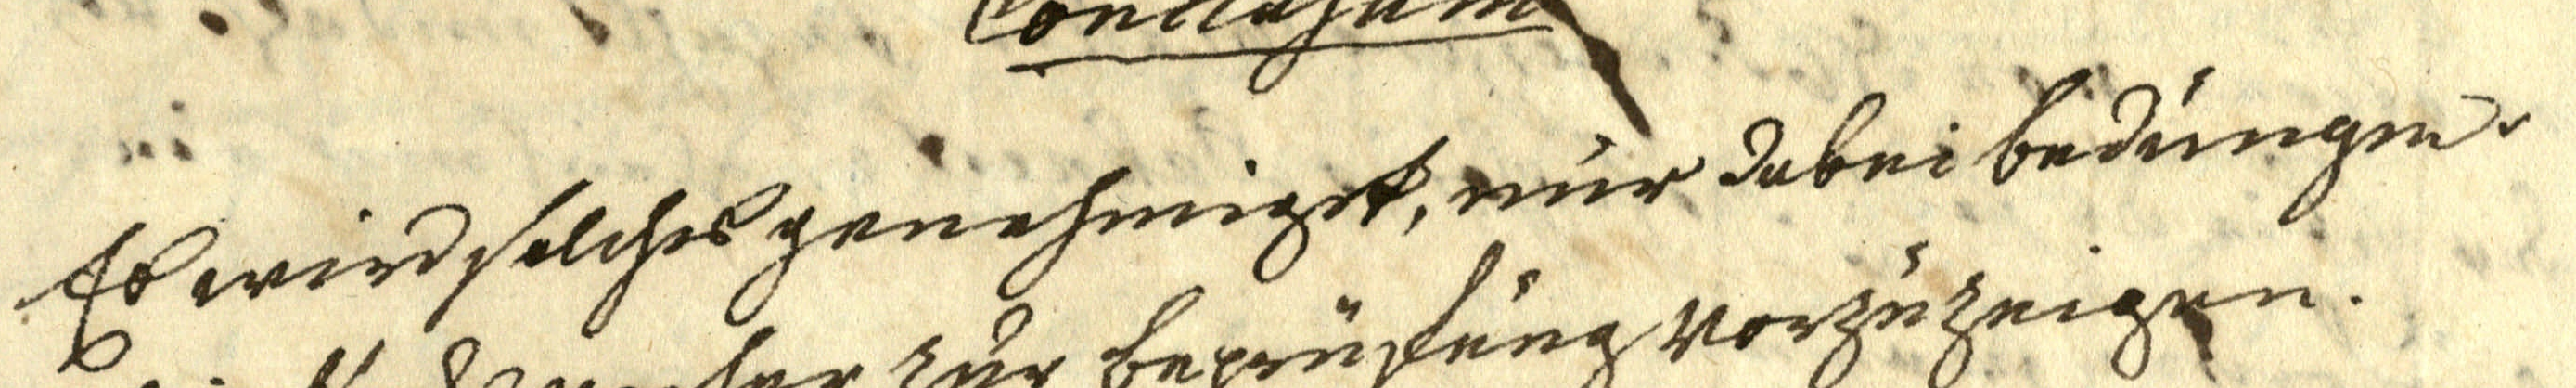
Es wird solches genehmiget, nur dabei bedungen,
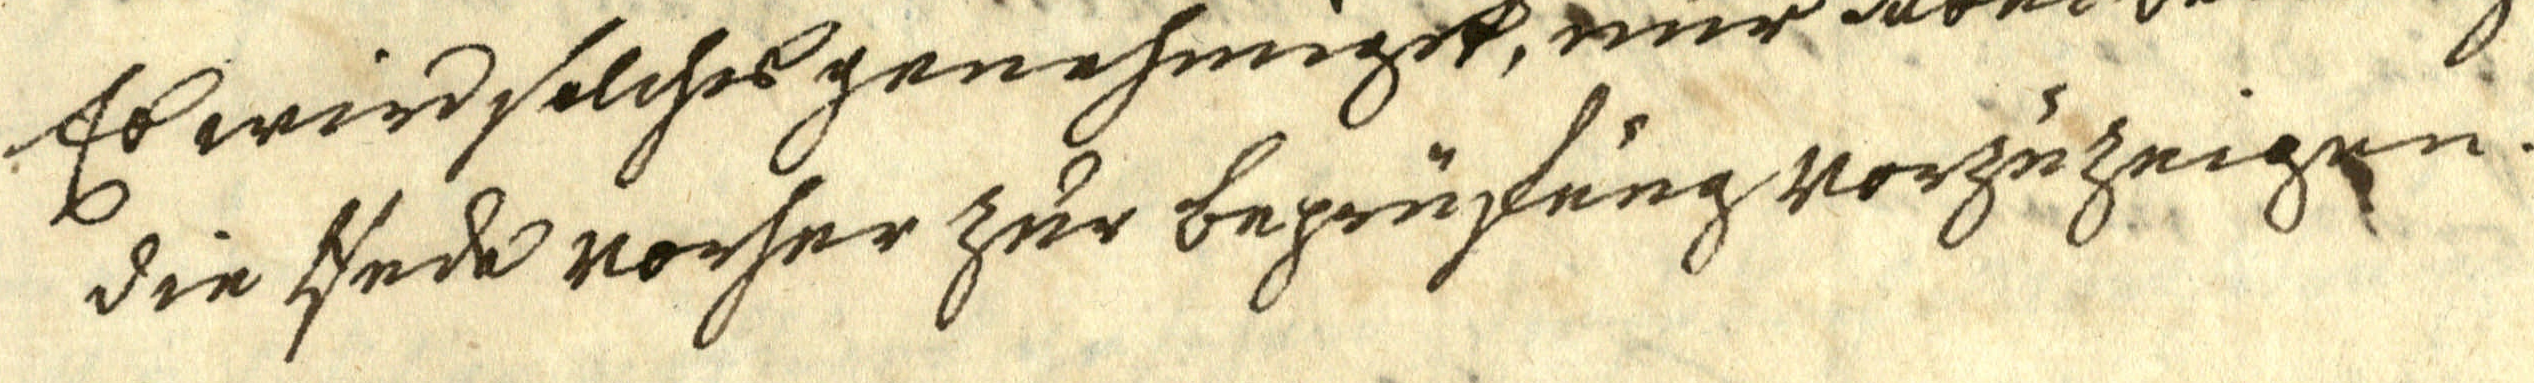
die Rede vorher zur Beprüfung vorzuzeigen.
